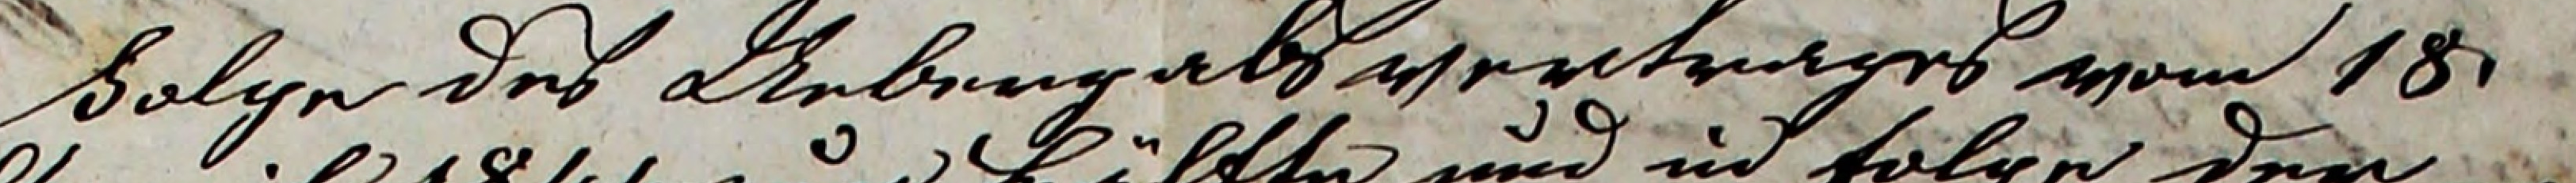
Folge des Uebergabsvertrages vom 18.
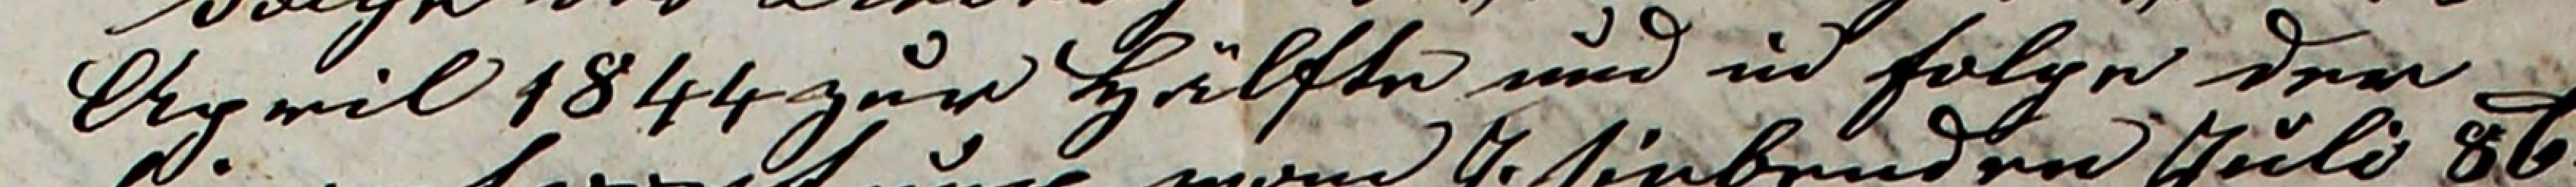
April 1844 zur Hälfte und in Folge der
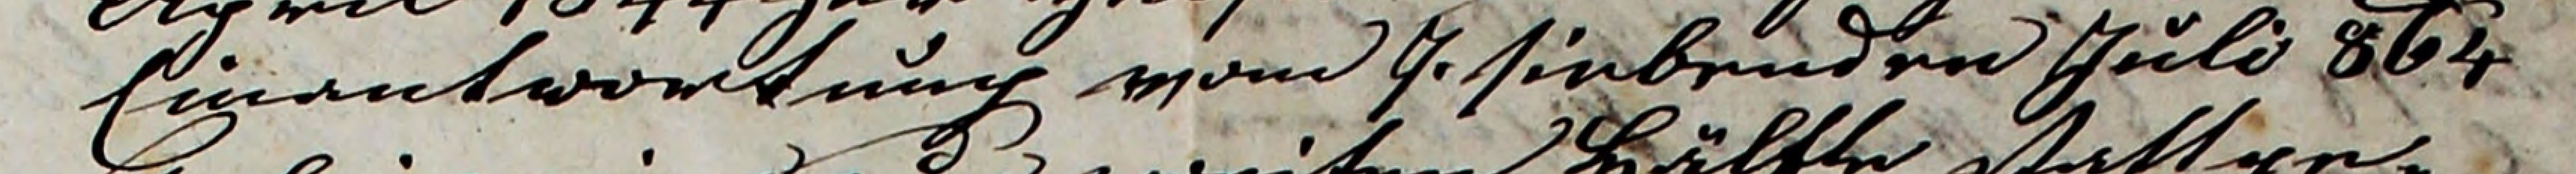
Einantwortung vom 7. siebenden Juli 864
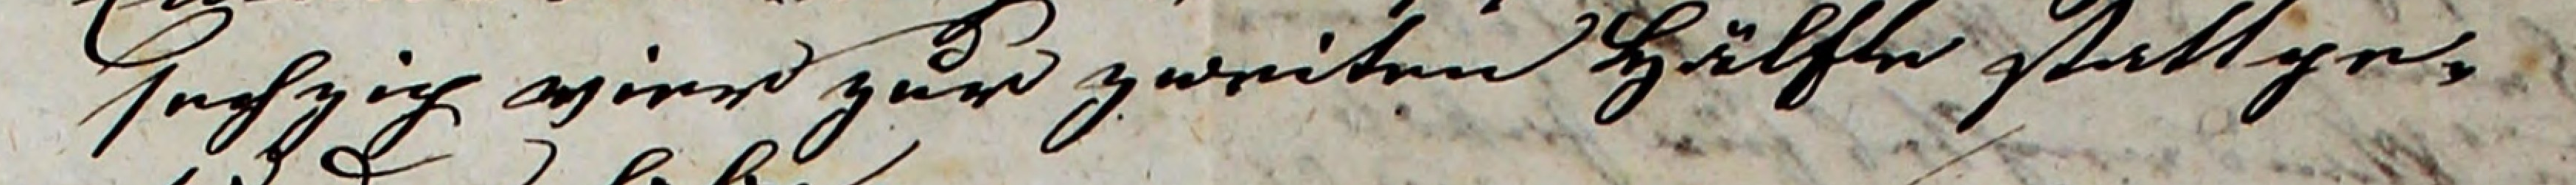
sechzig vier zur zweiten Hälfte stattge„
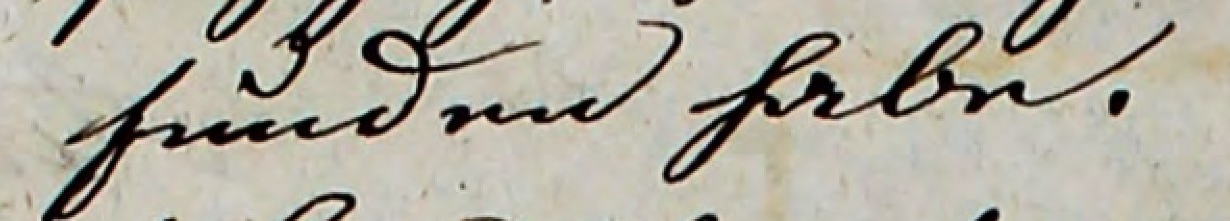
funden habe.
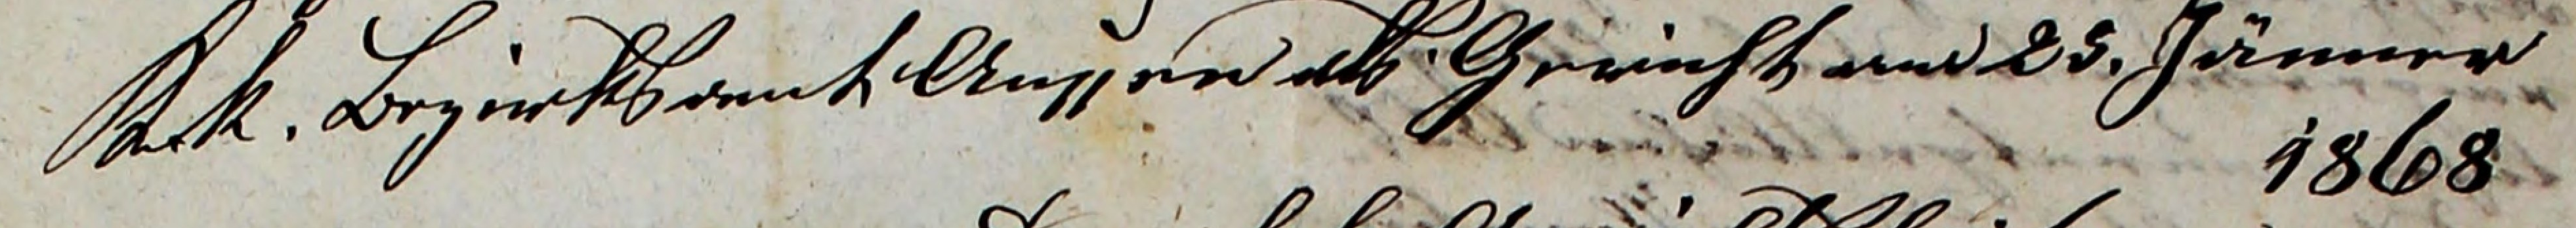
k.k. Bezirks ank Aussee als Gericht am 25. Jänner
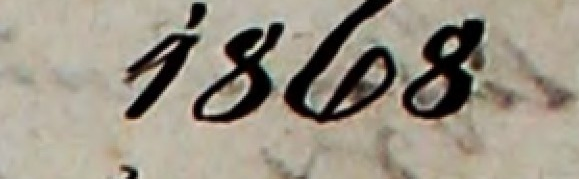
1868
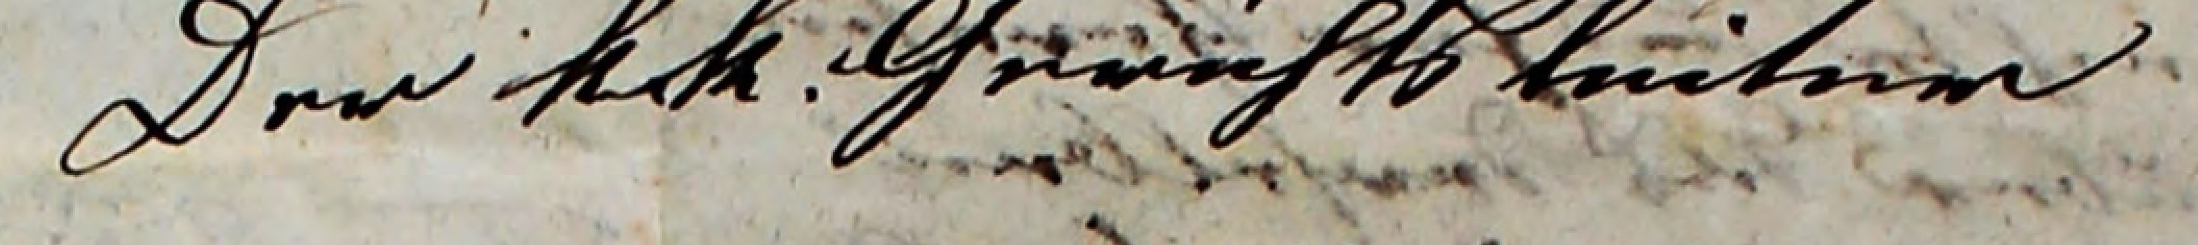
Der k.k. Gerichtsleiter
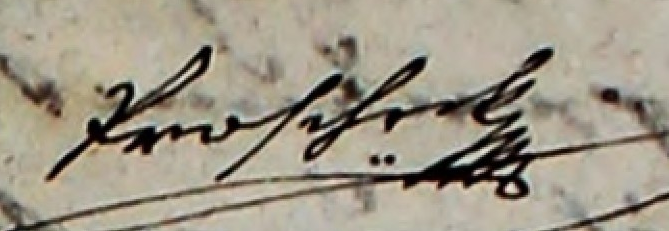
Proscheck
